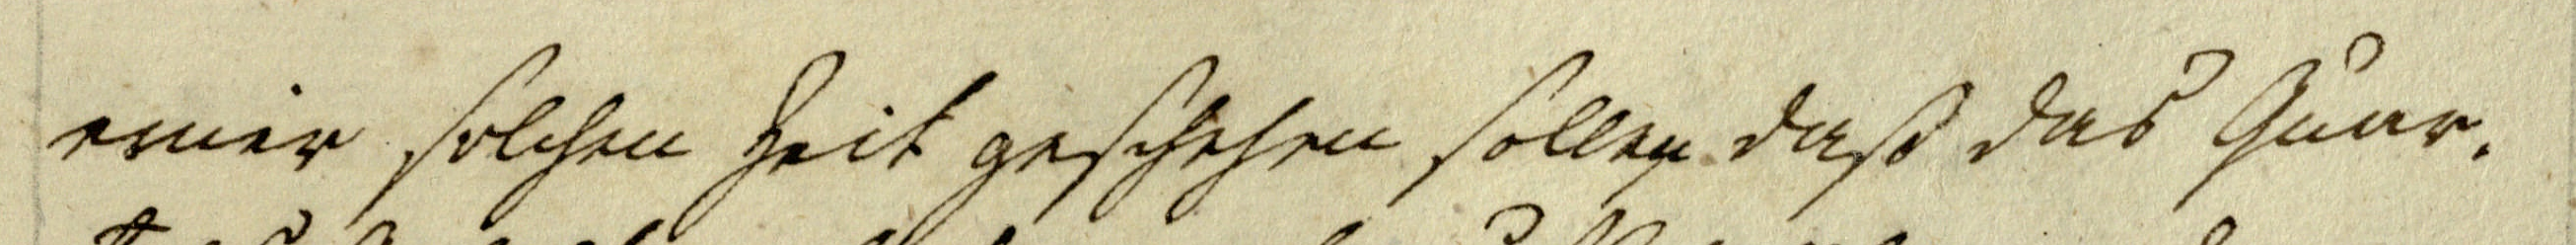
einer solchen Zeit geschehen sollen, daß das Quar¬
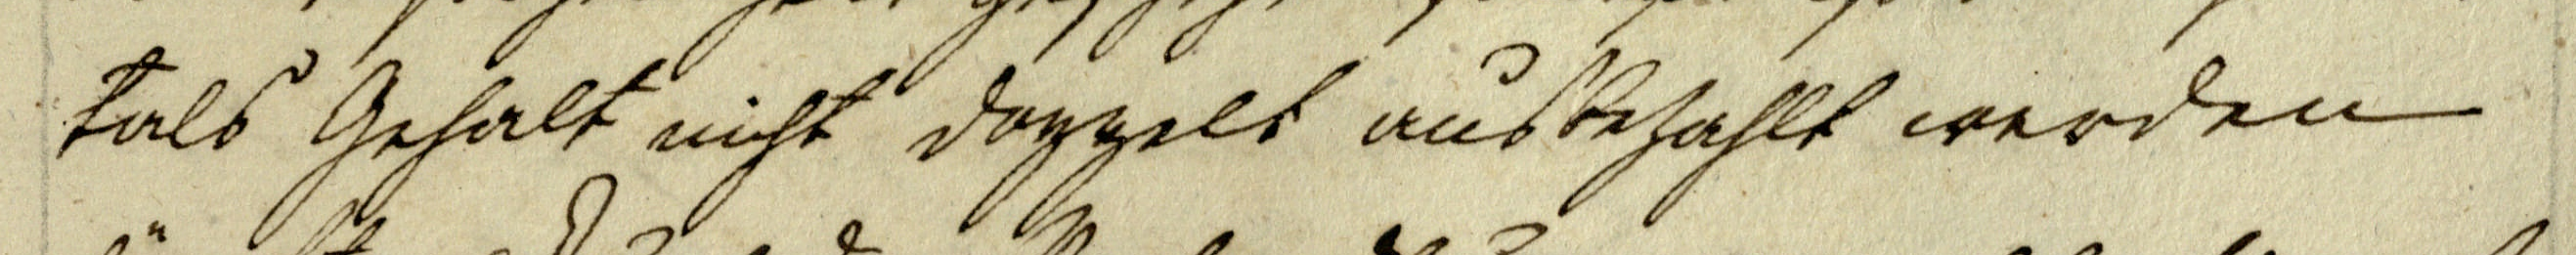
tals Gehalt nicht doppelt ausbezahlt werden
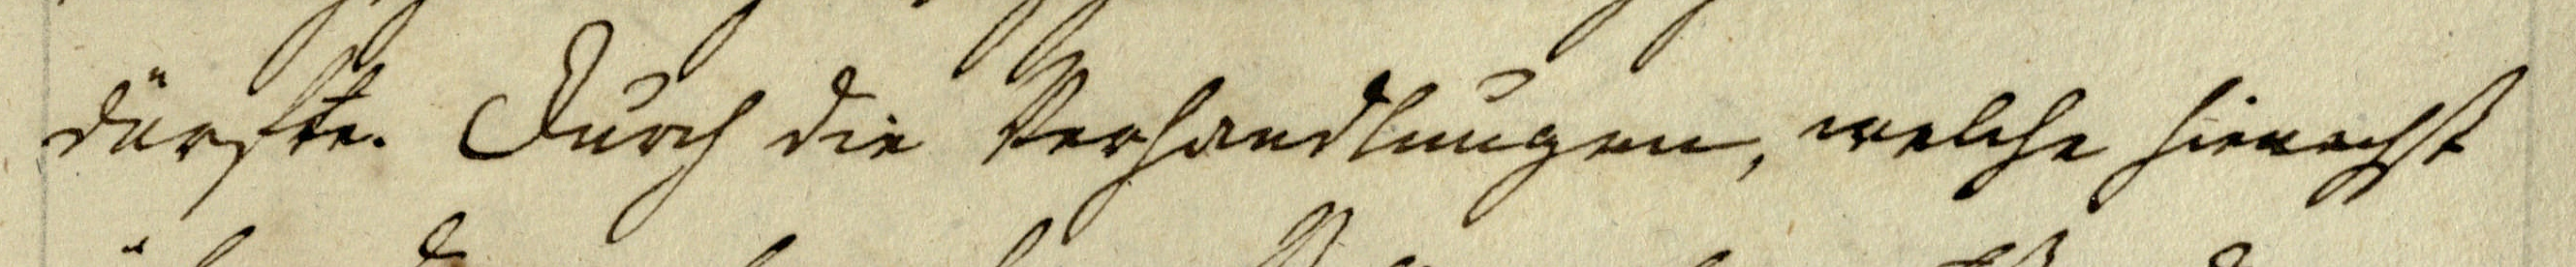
dürfte. Durch die Verhandlungen, welche hienechst
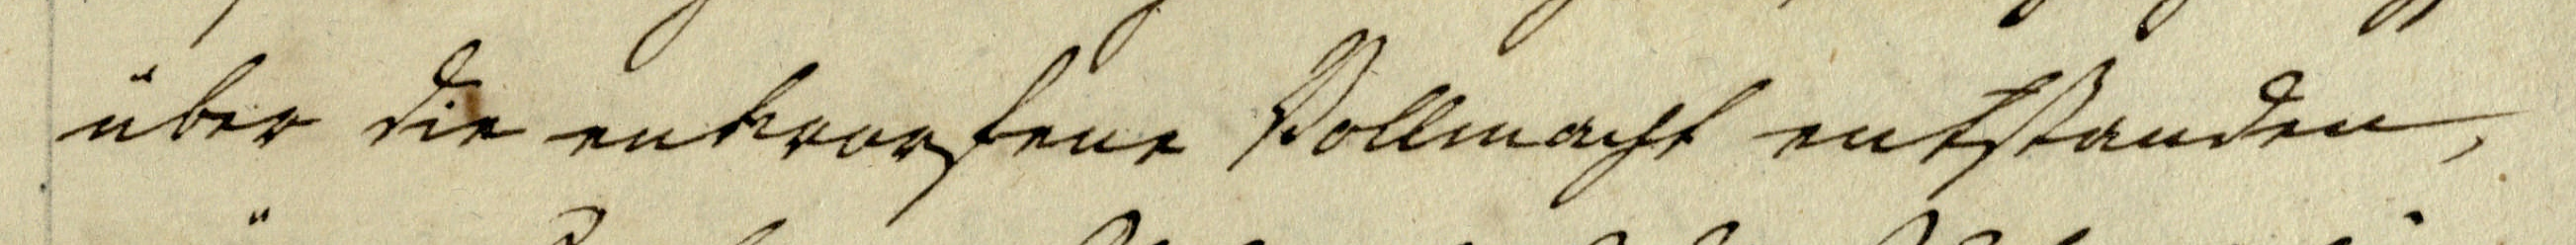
über die entworfene Vollmacht entstanden,
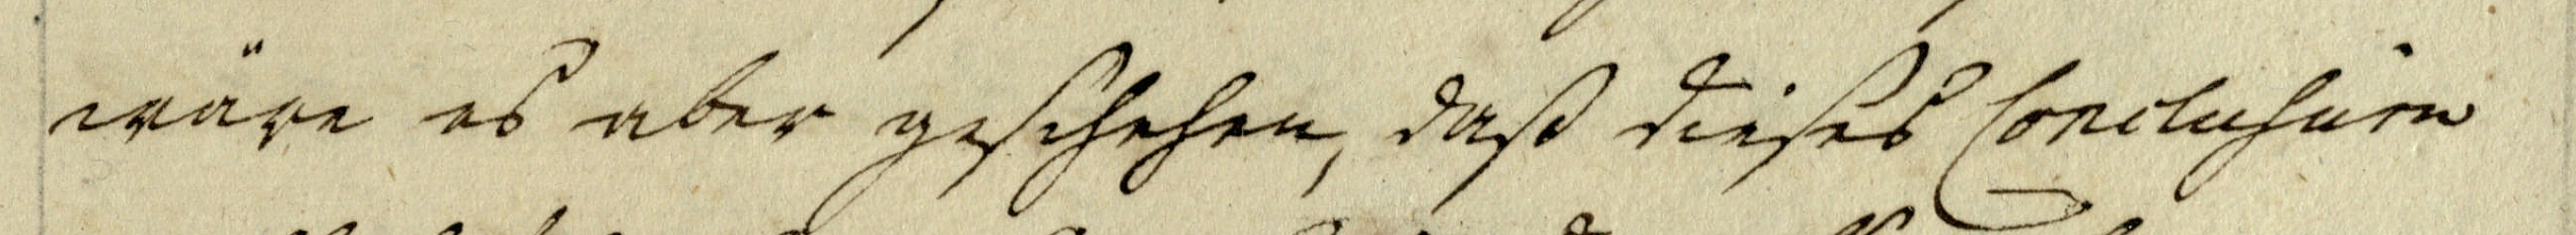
wäre es aber geschehen, daß dieses Conclusum
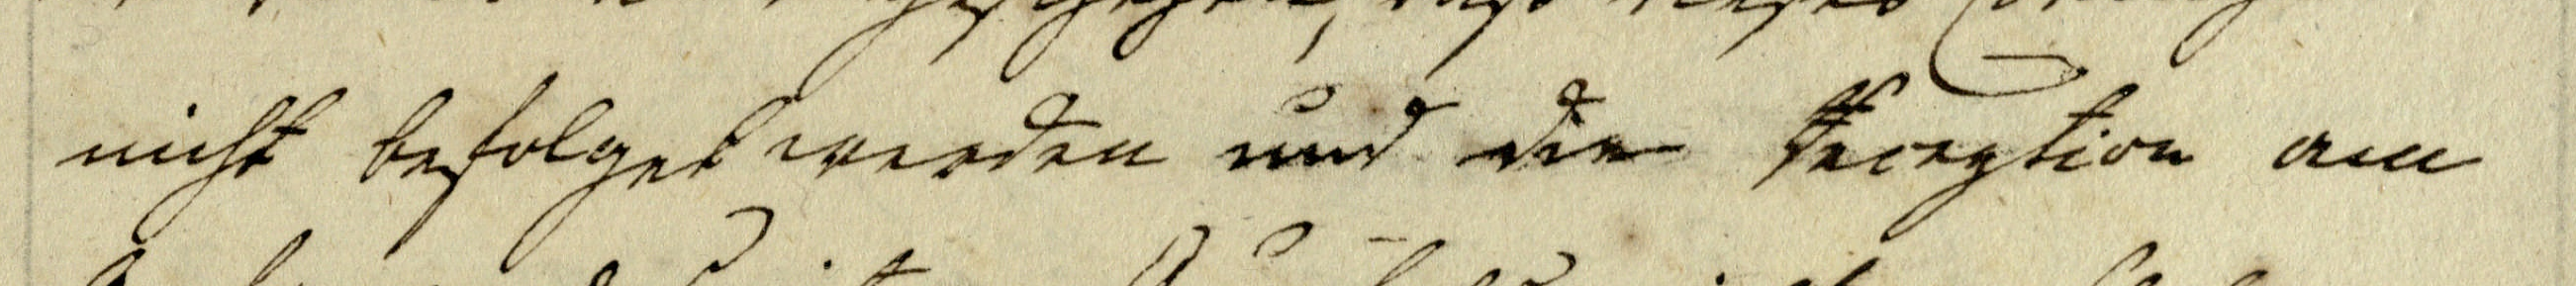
nicht befolget werden und die Reception am
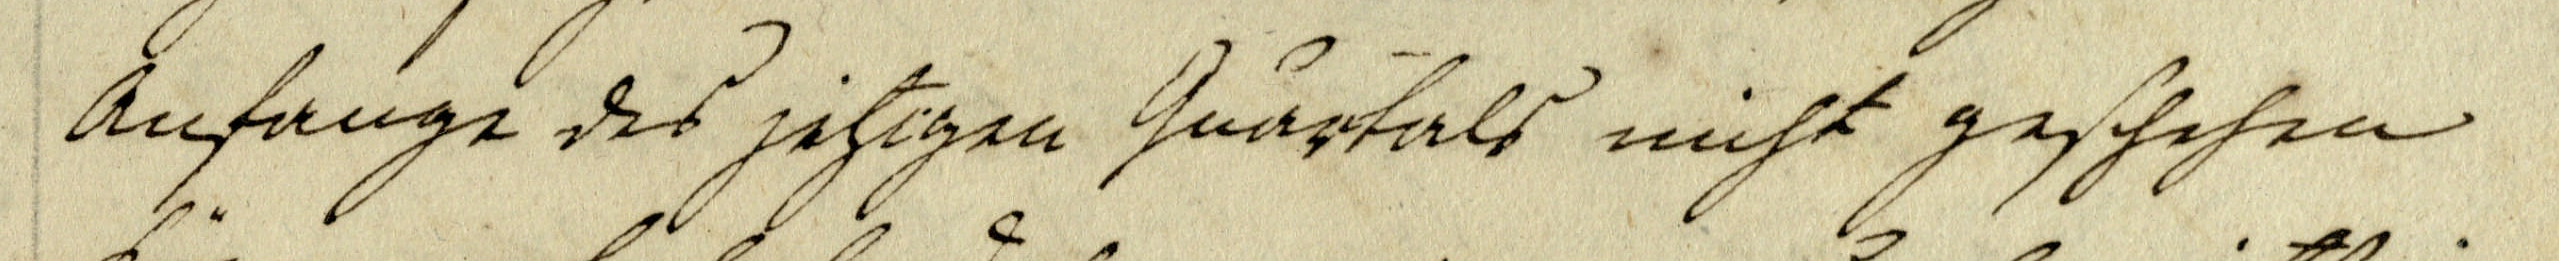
Anfange des jetzigen Quartals nicht geschehen
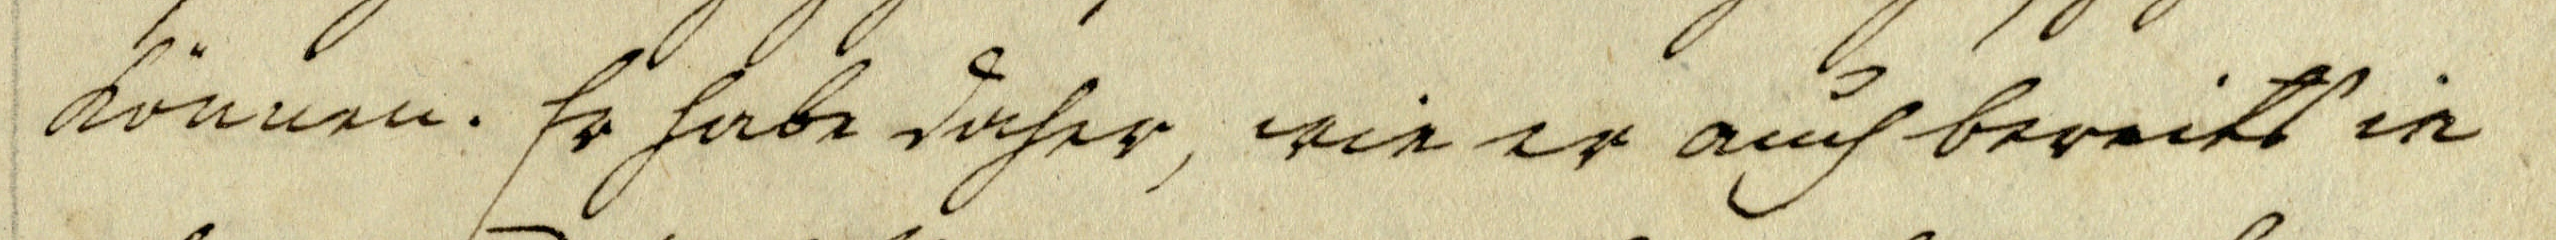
können. Er habe daher, wie er auch bereits in
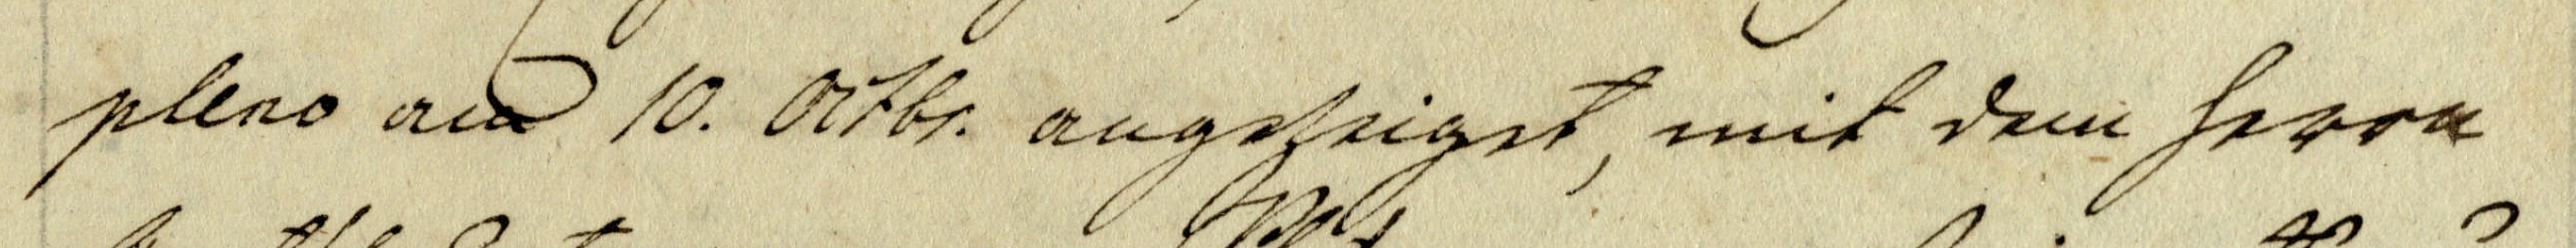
pleno am 10. Octbr. angezeiget, mit dem Herrn
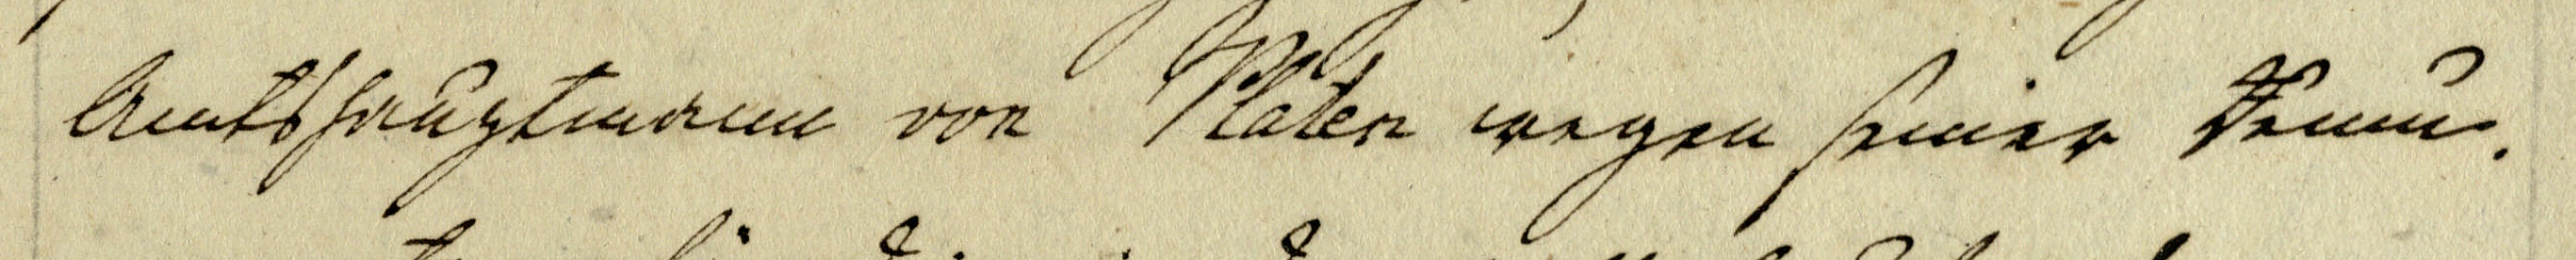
Amtshauptmann von Platen wegen seiner Remu¬
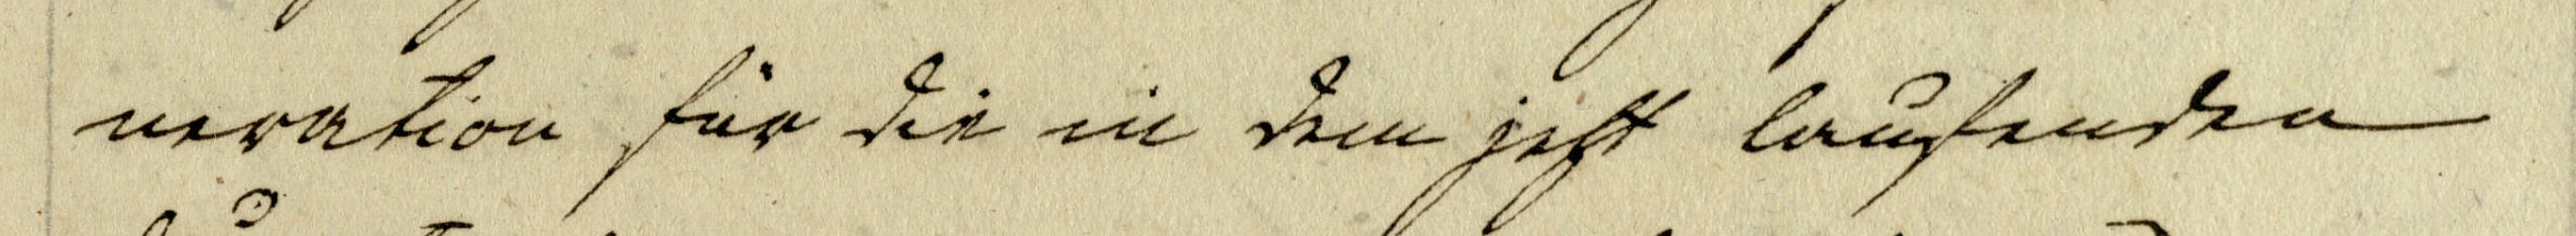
neration für die in dem jetzt laufenden
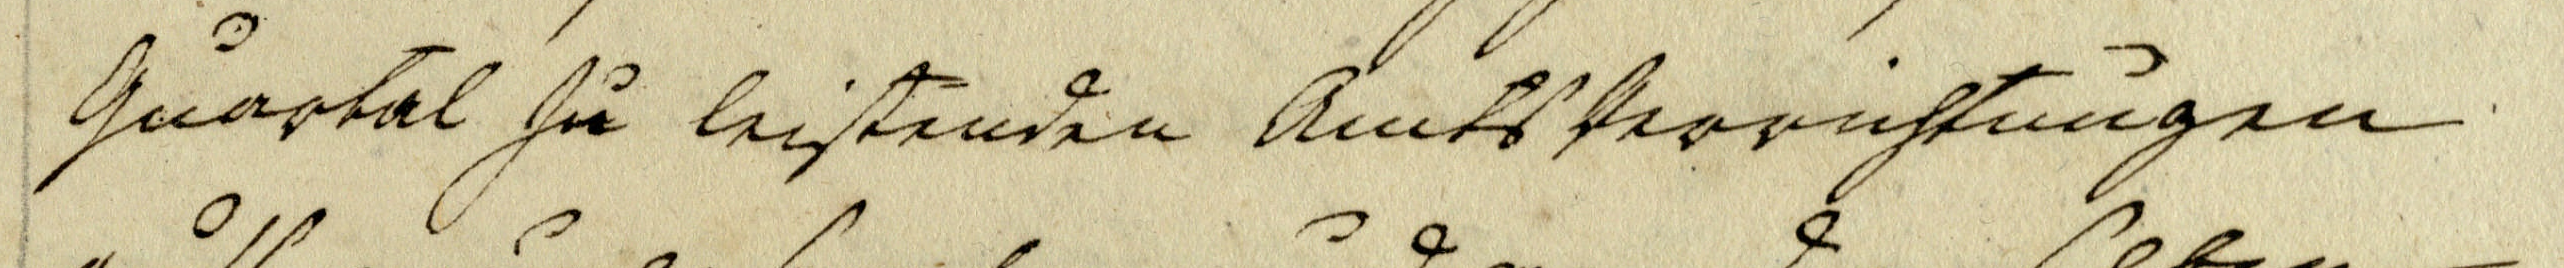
Quartal zu leistenden Amts Verrichtungen
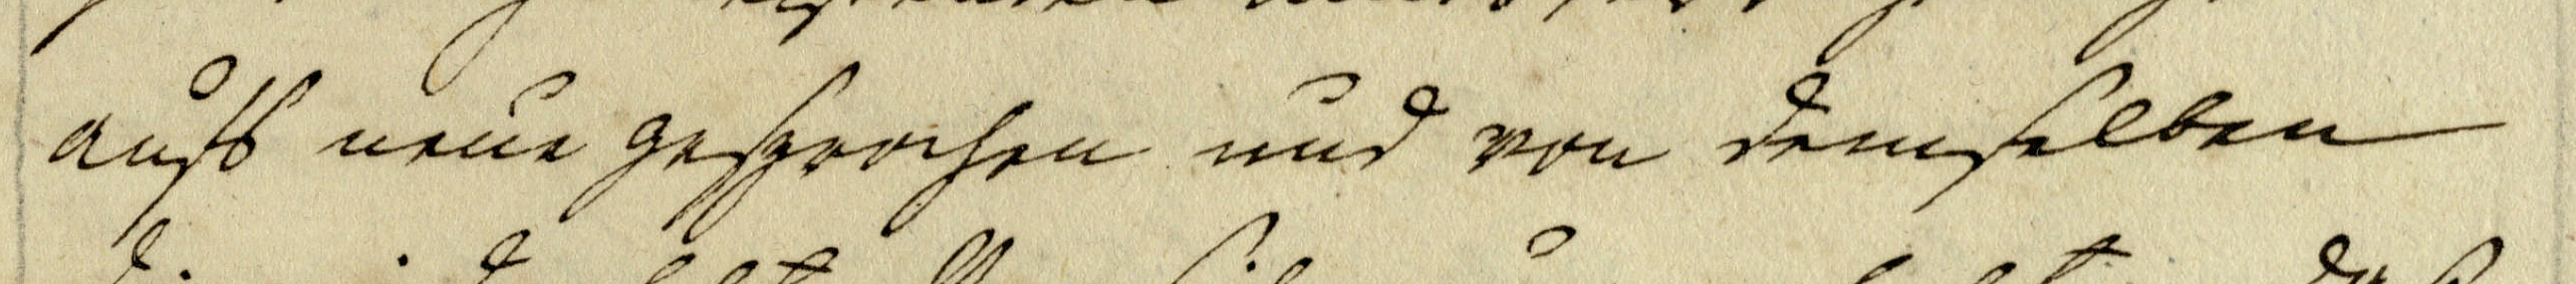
aufs neue gesprochen und von demselben
